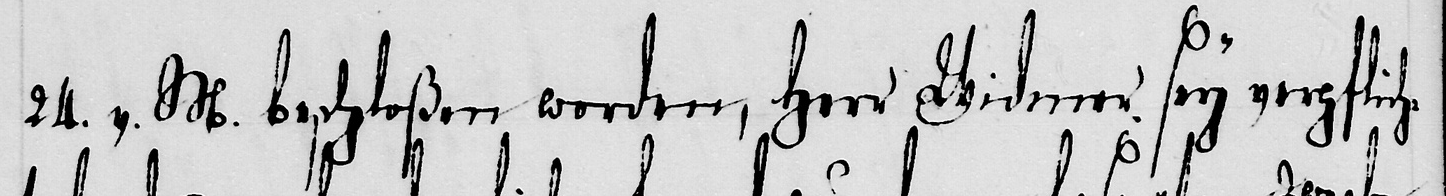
24. v. M. beschloßen worden, Herr Widmer sey verpflic¬
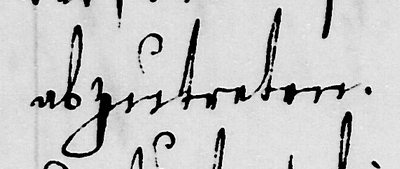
abzutreten.
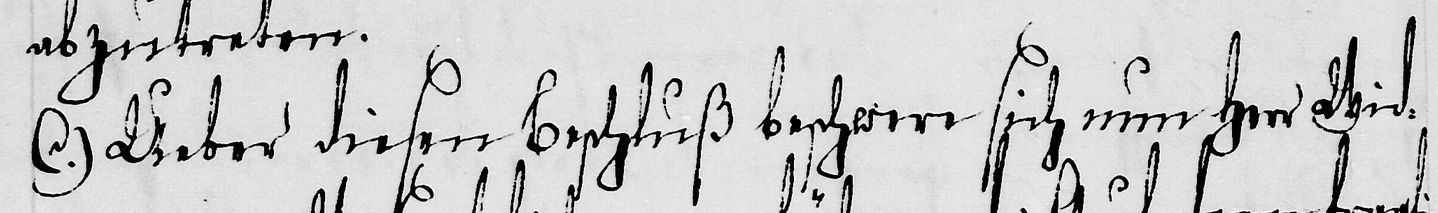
C.) Ueber diesen Beschluß beschwere sich nun Herr Wid¬
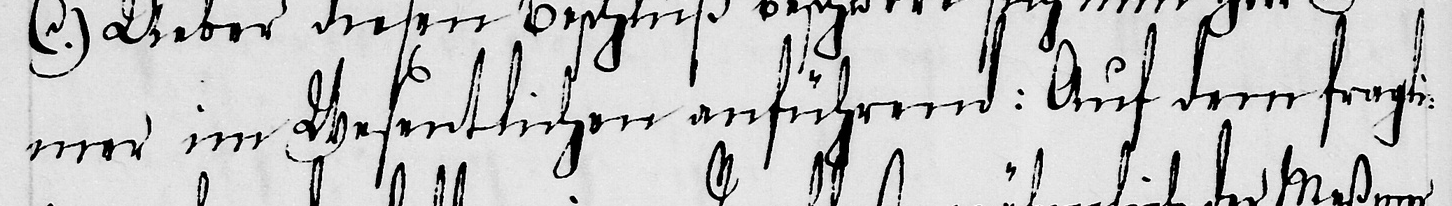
mer im Wesentlichen anführend: Auf dem fragl¬
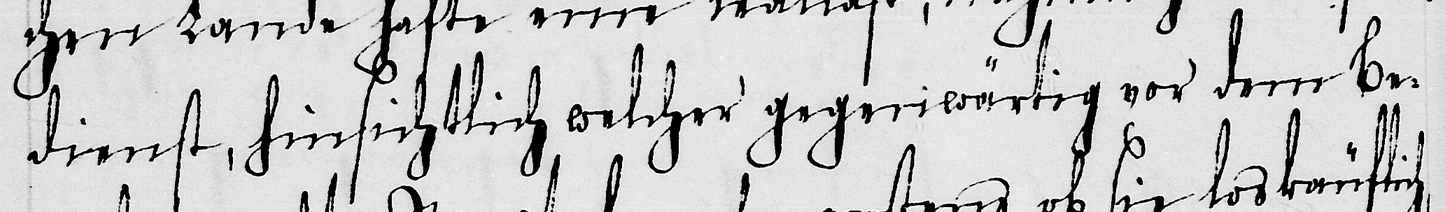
dienst, hinsichtlich welcher gegenwärtig vor dem Be¬
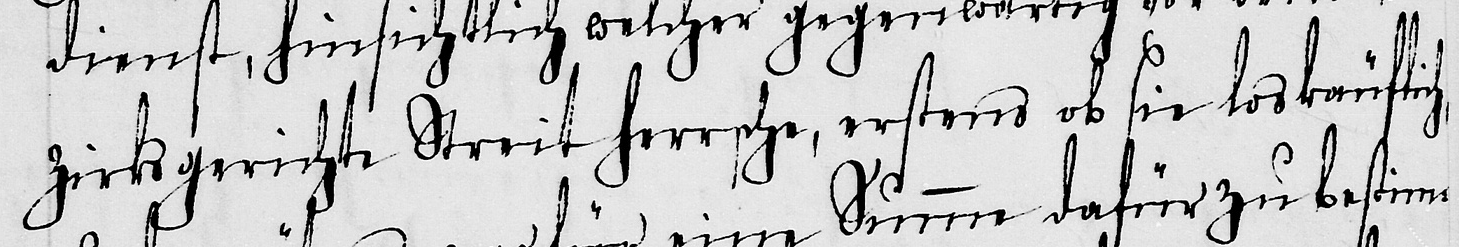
zirksrathe Streit herrsche, erstens ob sie loskäufli¬
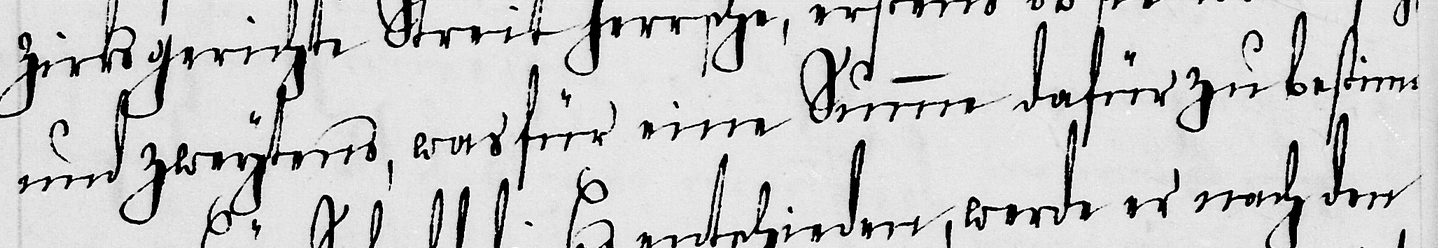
und zweytens, was für eine Summe dafür zu bestim¬
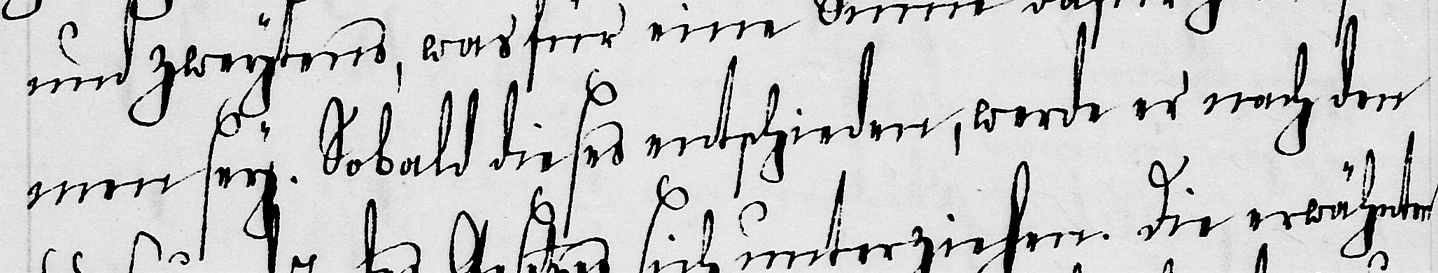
men sey. Sobald dieses entschieden, werde er nach den
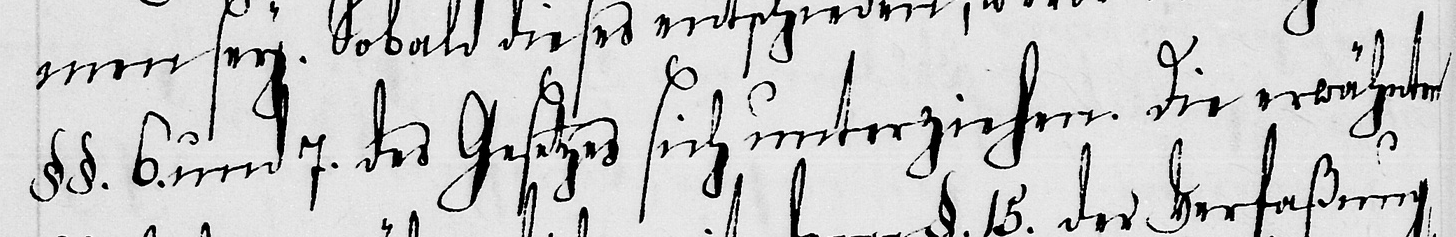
6. und 7. des Gesetzes sich unterziehen. Die erwähnten
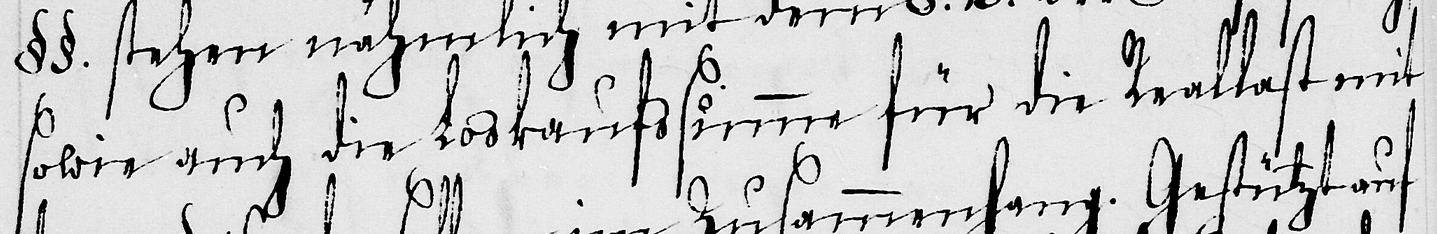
sowie auch die Loskaufssumme für die Reallast mit
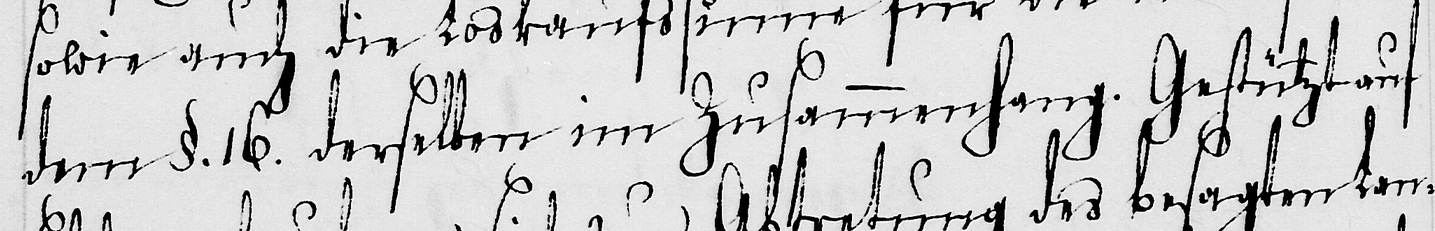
dem §. 16. derselben im Zusammenhang. Gestützt a¬
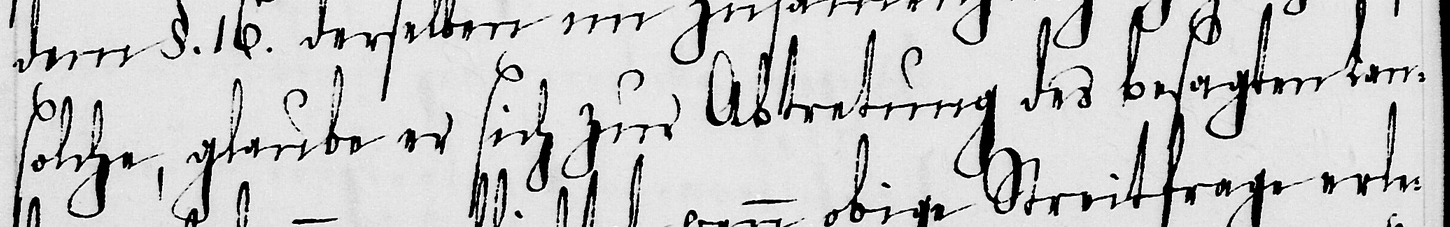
solche, glaube er sich zur Abtretung des besagten Lan¬
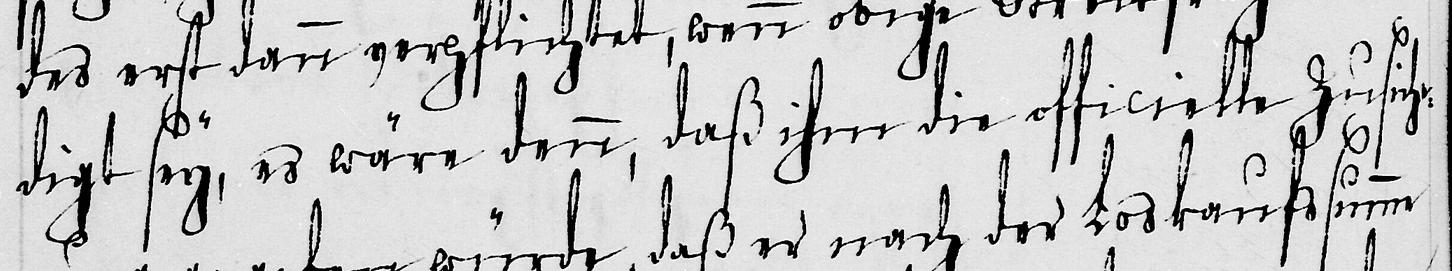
digt sey, es wäre denn, daß ihm die officielle Zusic¬
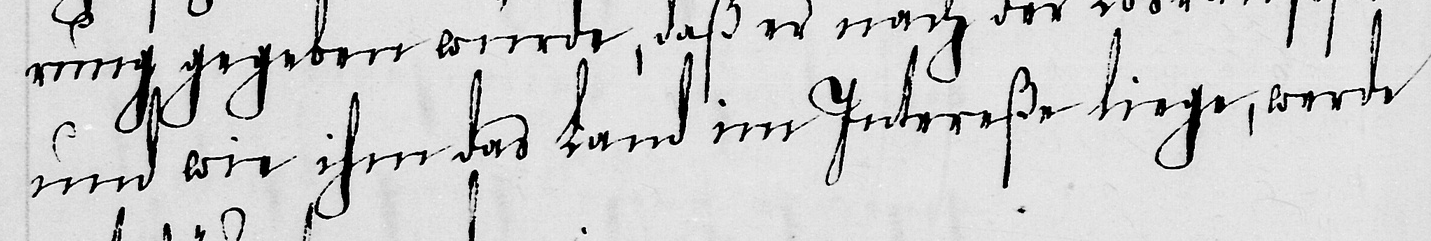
und wie ihm das Land im Intereße liege, werde
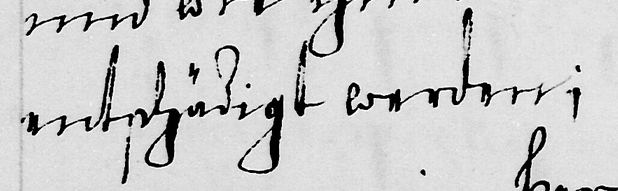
entschädigt werden;
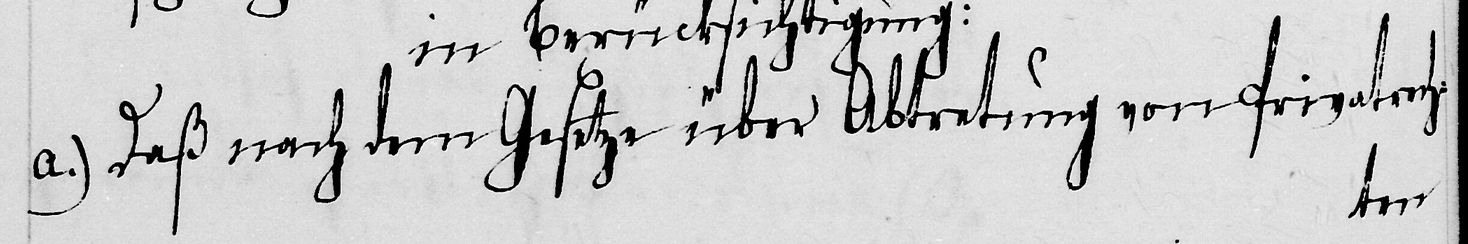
a.) Daß nach dem Gesetze über Abtretung von Privatrec¬
